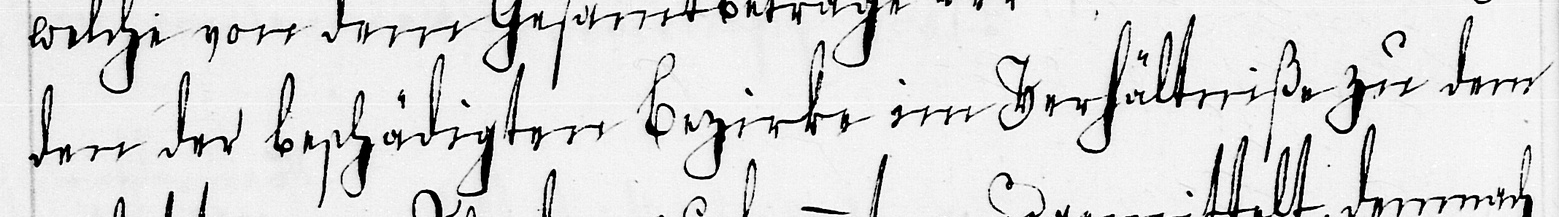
den der beschädigten Bezirke im Verhältniße zu dem
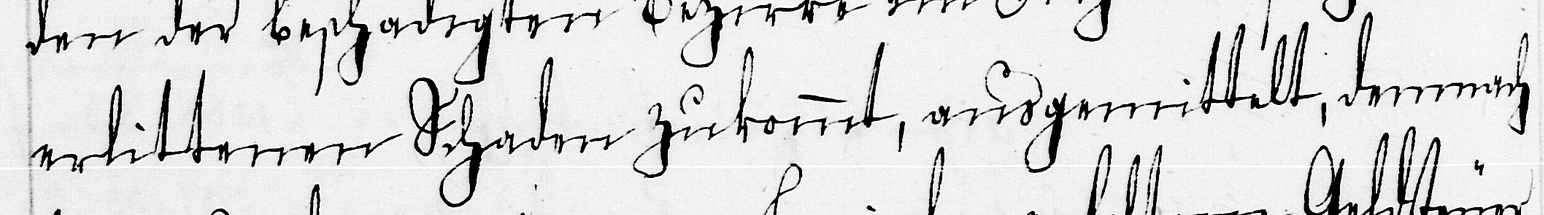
erlittenen Schaden zukommt, ausgemittelt, demnach
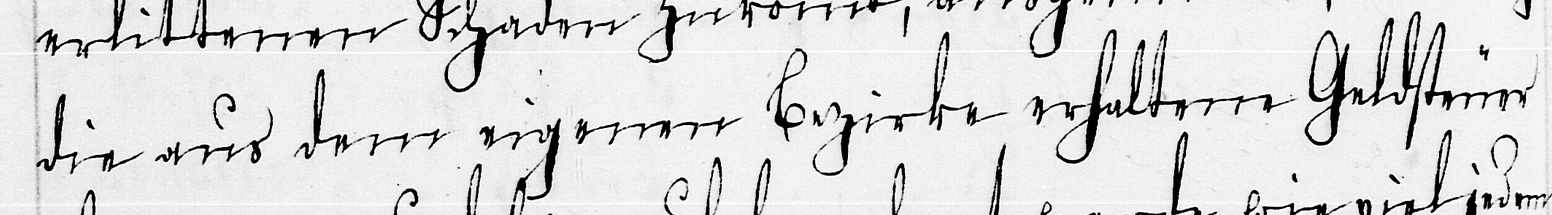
die aus dem eigenen Bezirke erhaltene Geldsteuer
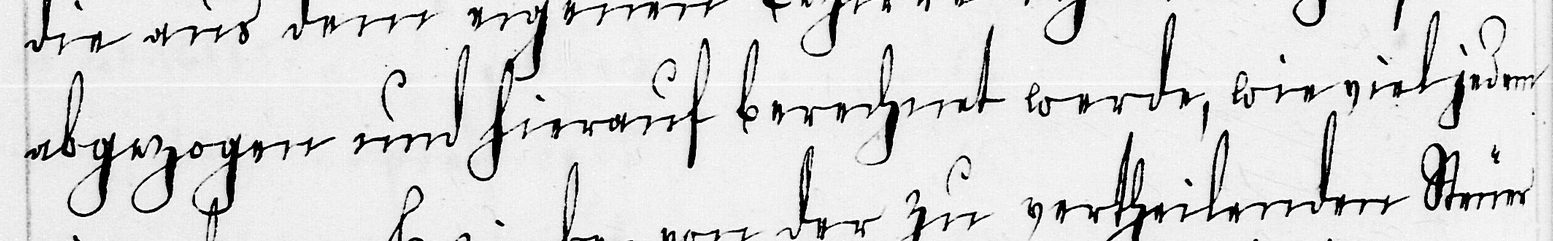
abgezogen und hierauf berechnet werde, wie viel jedem
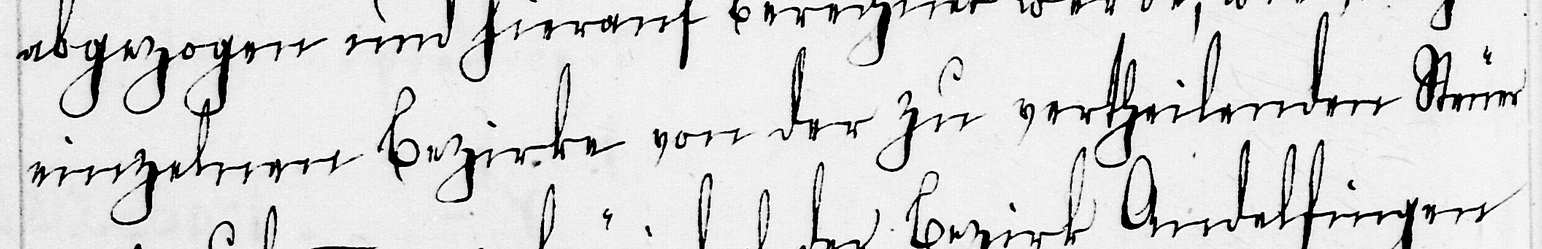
einzelnen Bezirke von der zu vertheilenden Steuer
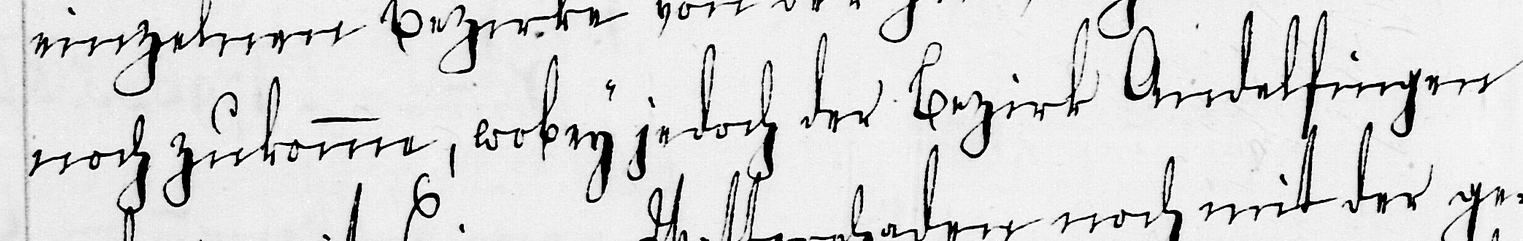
noch zukomme, wobey jedoch der Bezirk Andelfingen
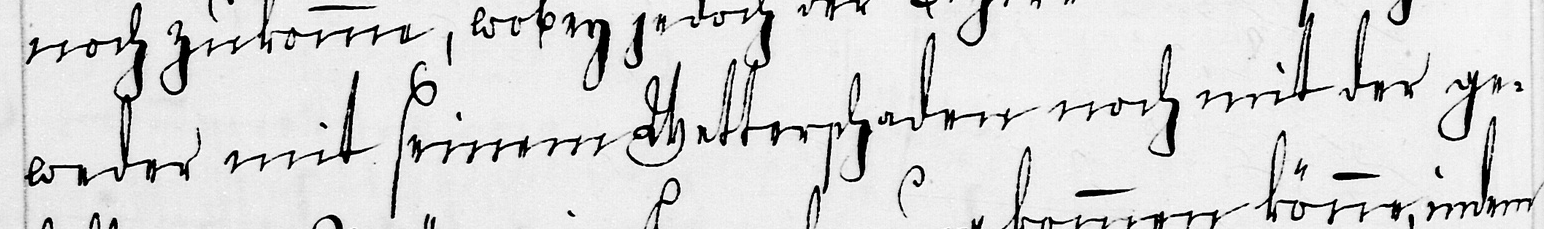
weder mit seinem Wetterschaden noch mit der ge¬
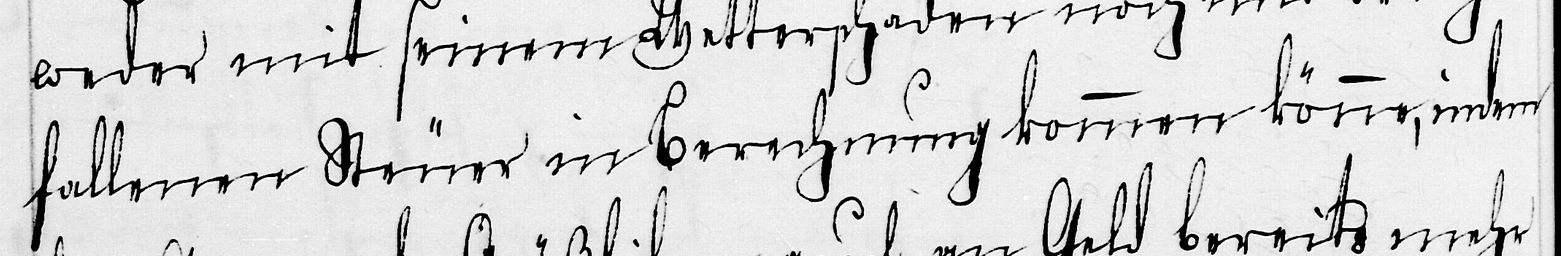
fallenen Steuer in Berechnung kommen könne, indem
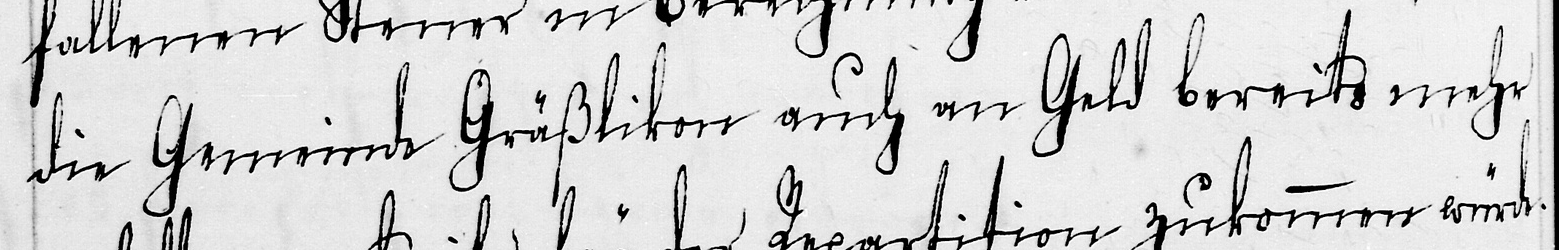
die Gemeinde Gräßlikon auch an Geld bereits mehr
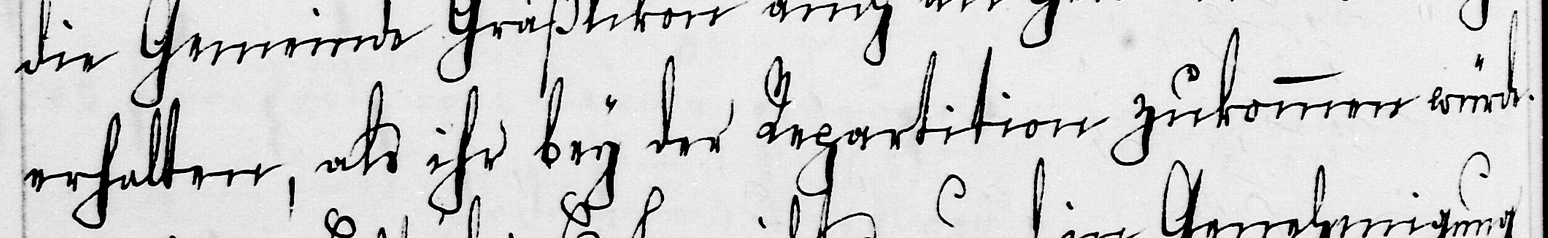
erhalten, als ihr bey der Repartition zukommen wür¬
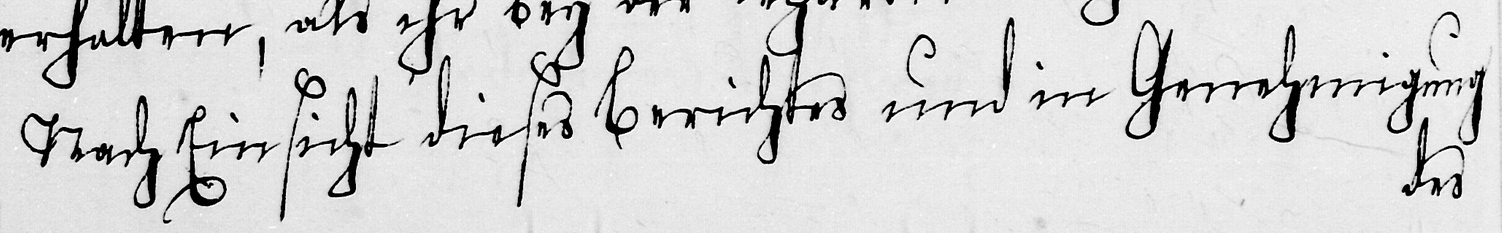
Nach Einsicht dieses Berichtes und in Genehmigung
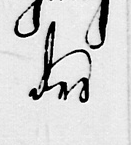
de.
